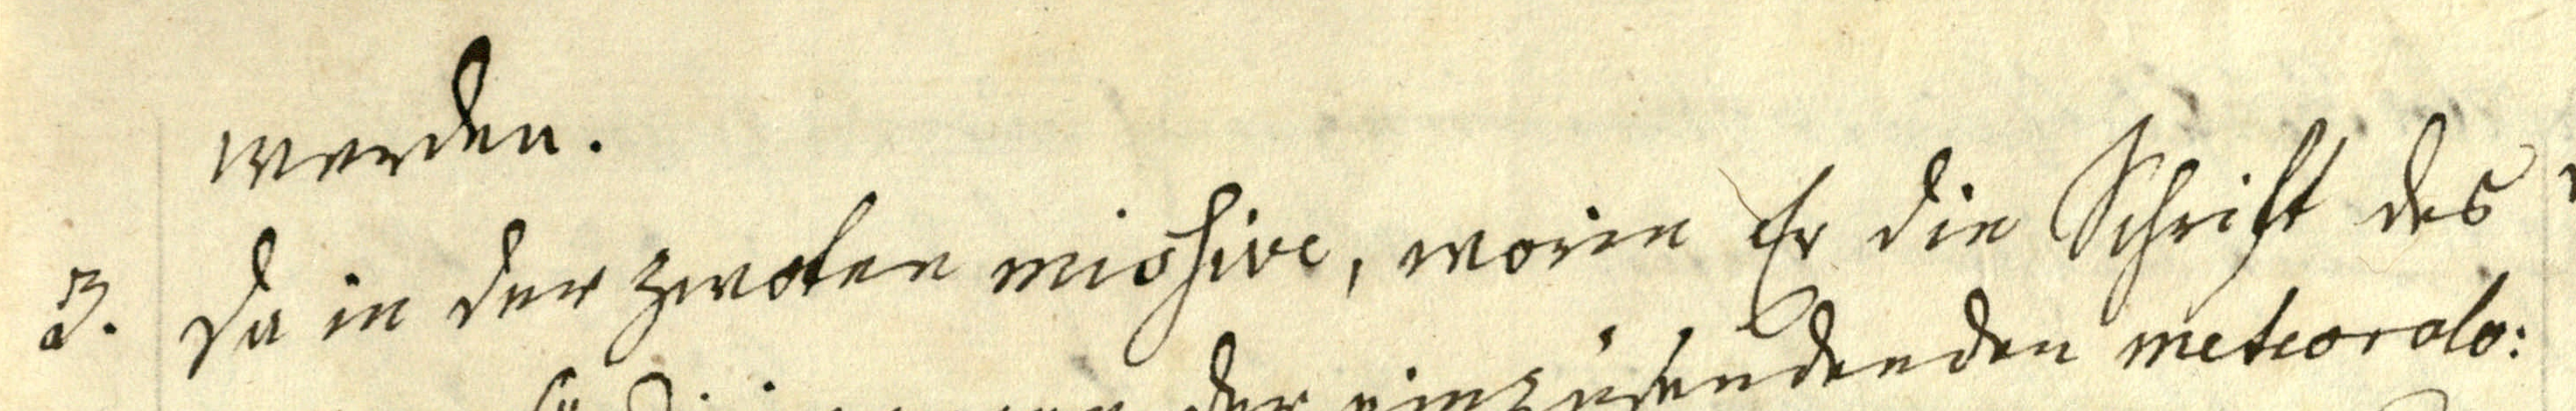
3. Da in der zwoten missive, worin Er die Schrift des
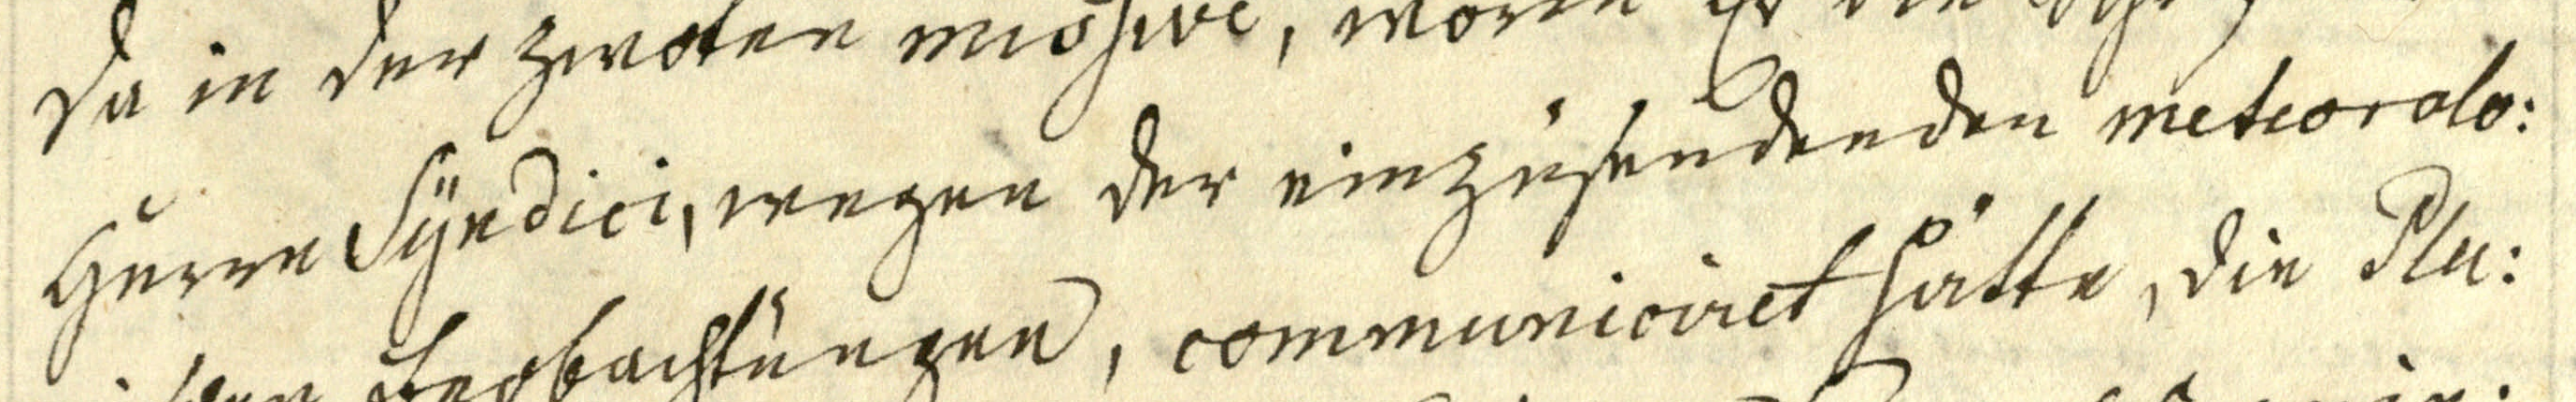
Herrn Sÿndici wegen der einzusendenden meteorolo¬
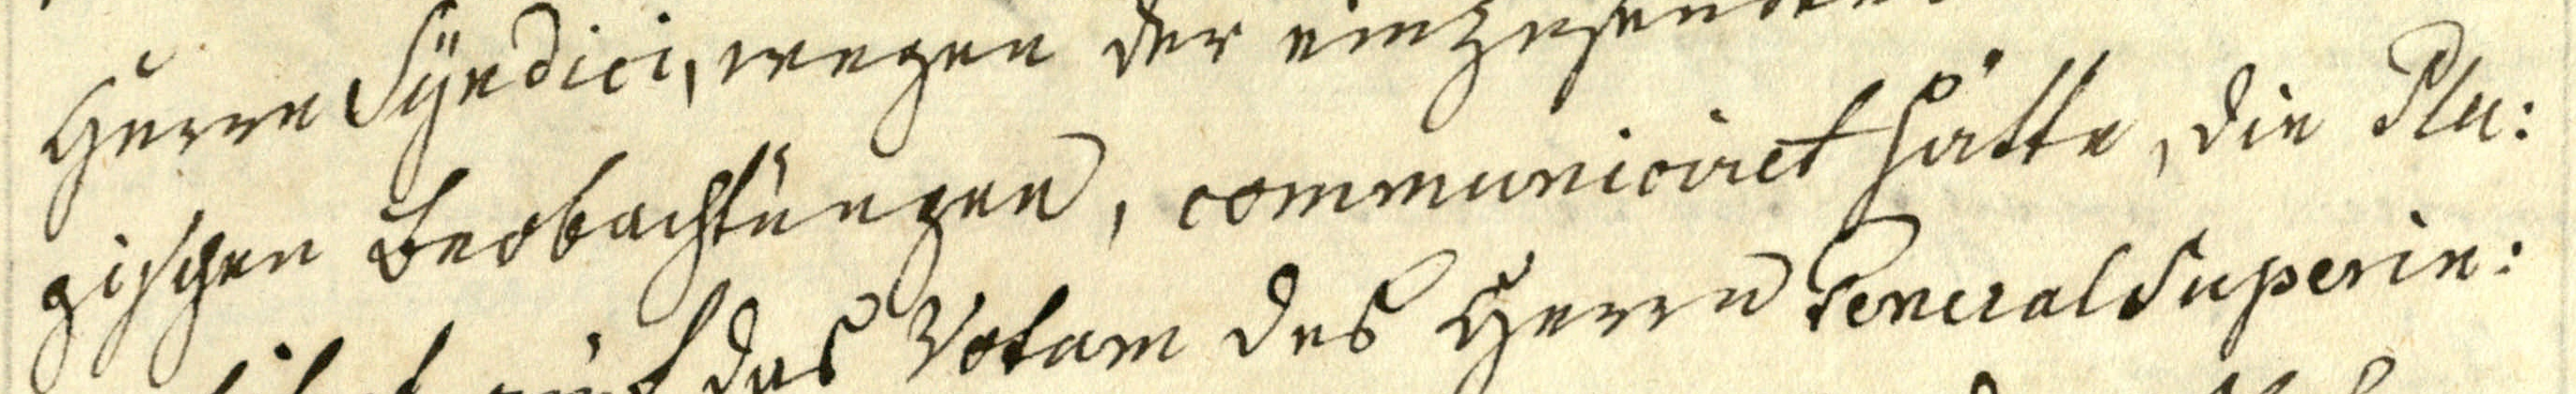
gischen Beobachtungen, communiciret hätte, die Plu¬
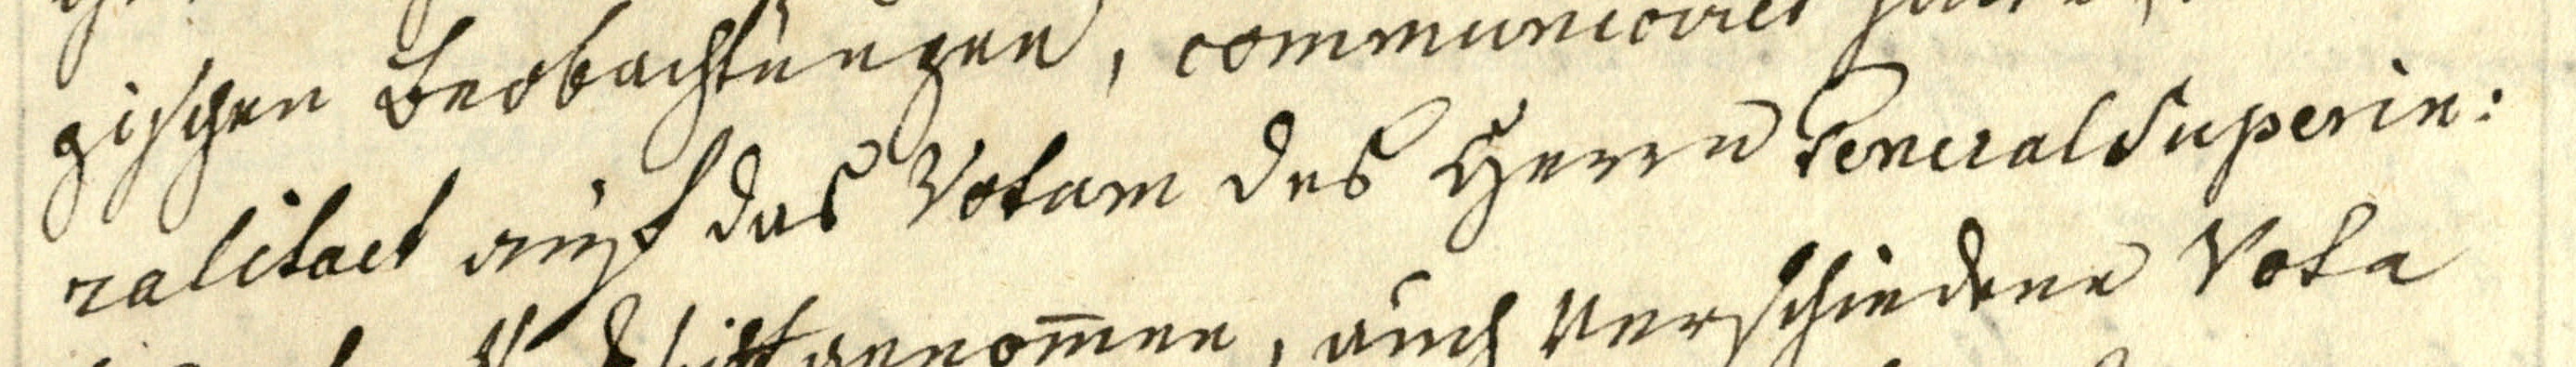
ralitaet auf das Votum des Herrn GeneralSuperin¬
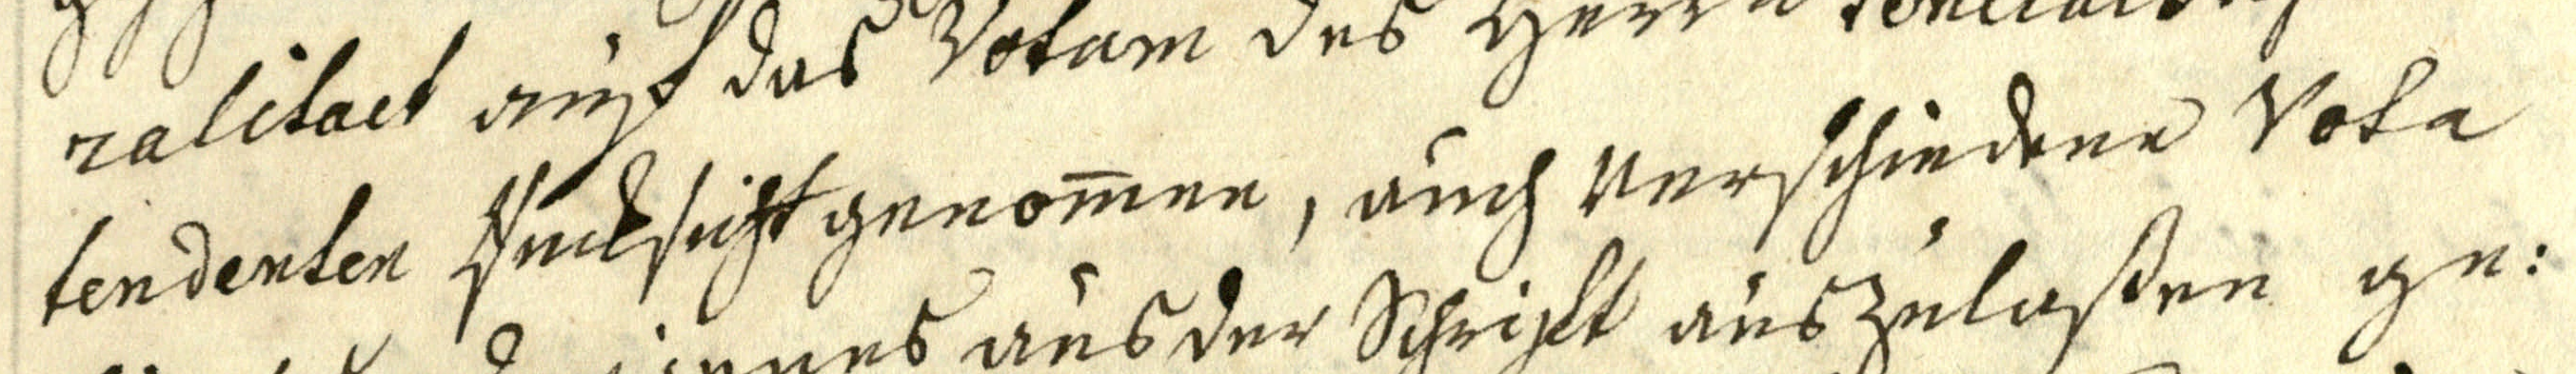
tendenten Rücksicht genomen, auch verschiedene Vota
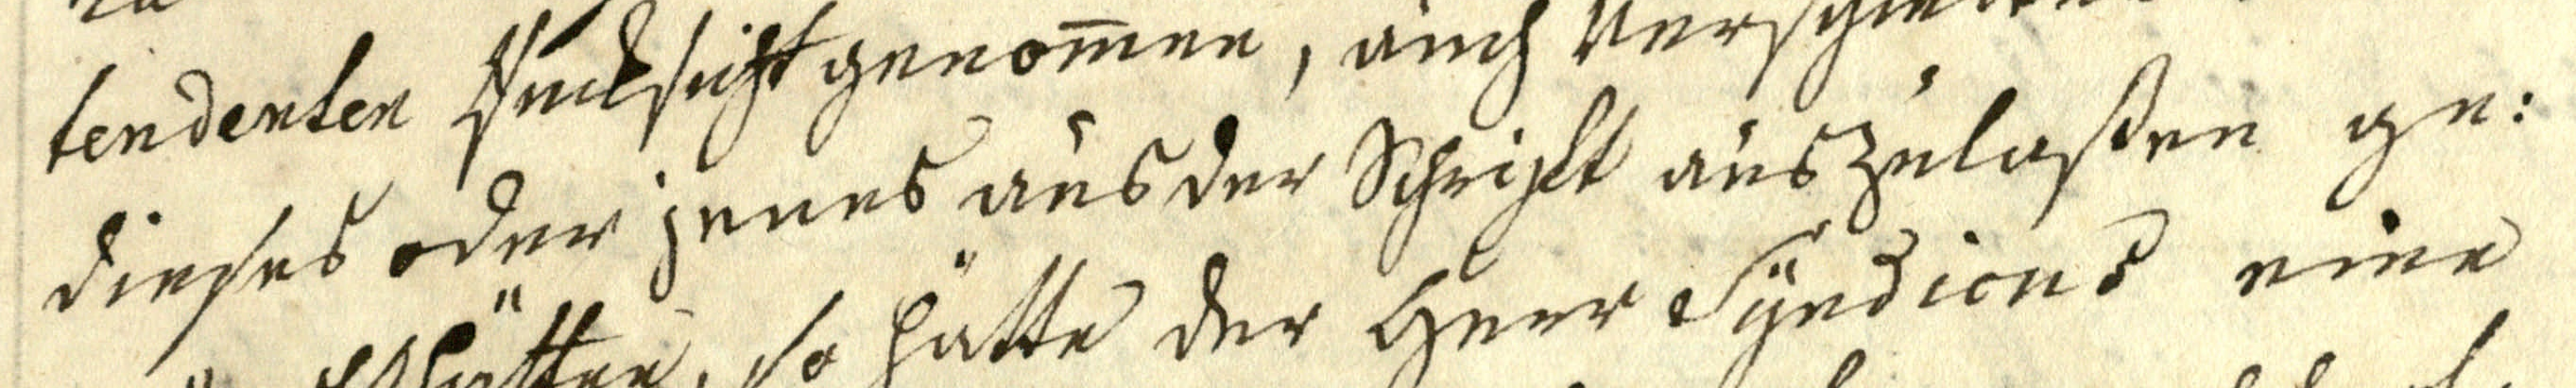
dieses oder jenes aus der Schrift auszulaßen ge¬
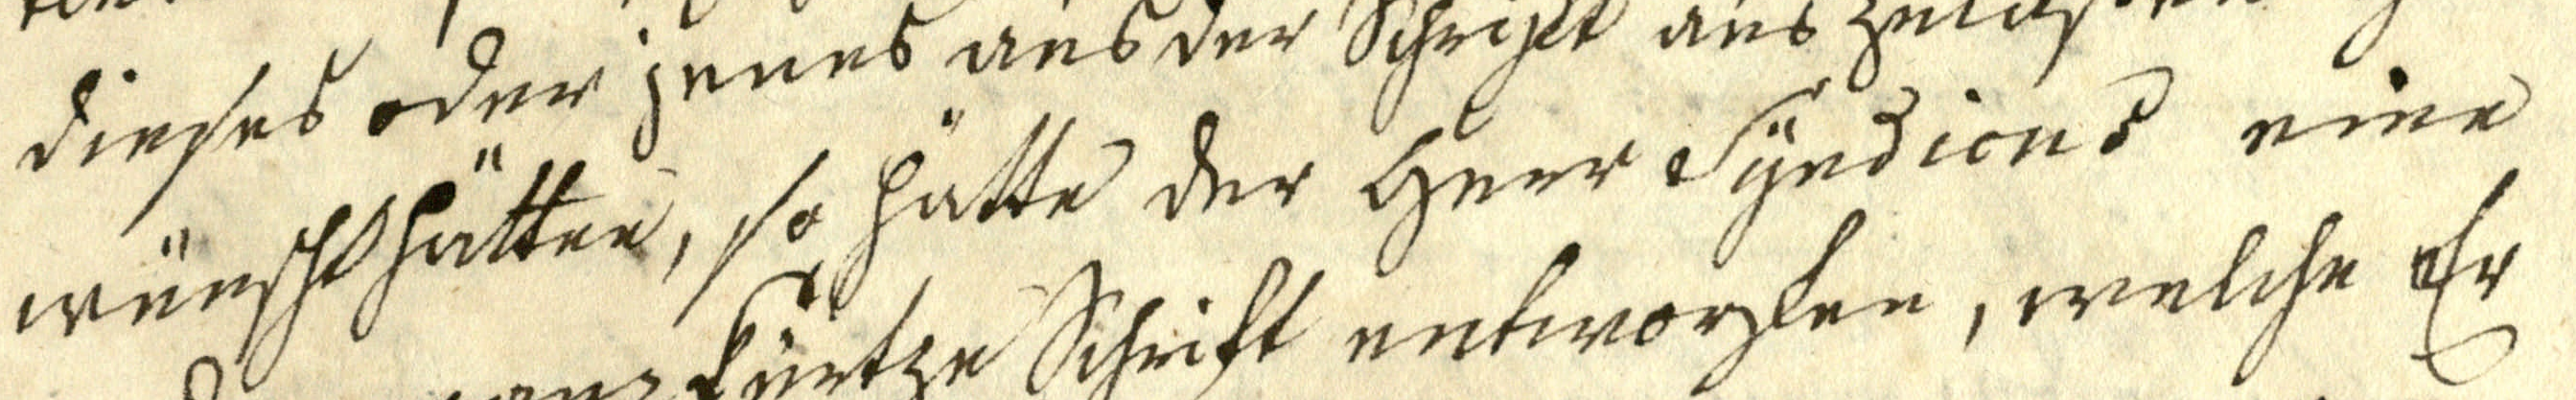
wünscht hätten, so hätte der Herr Sÿndicus eine
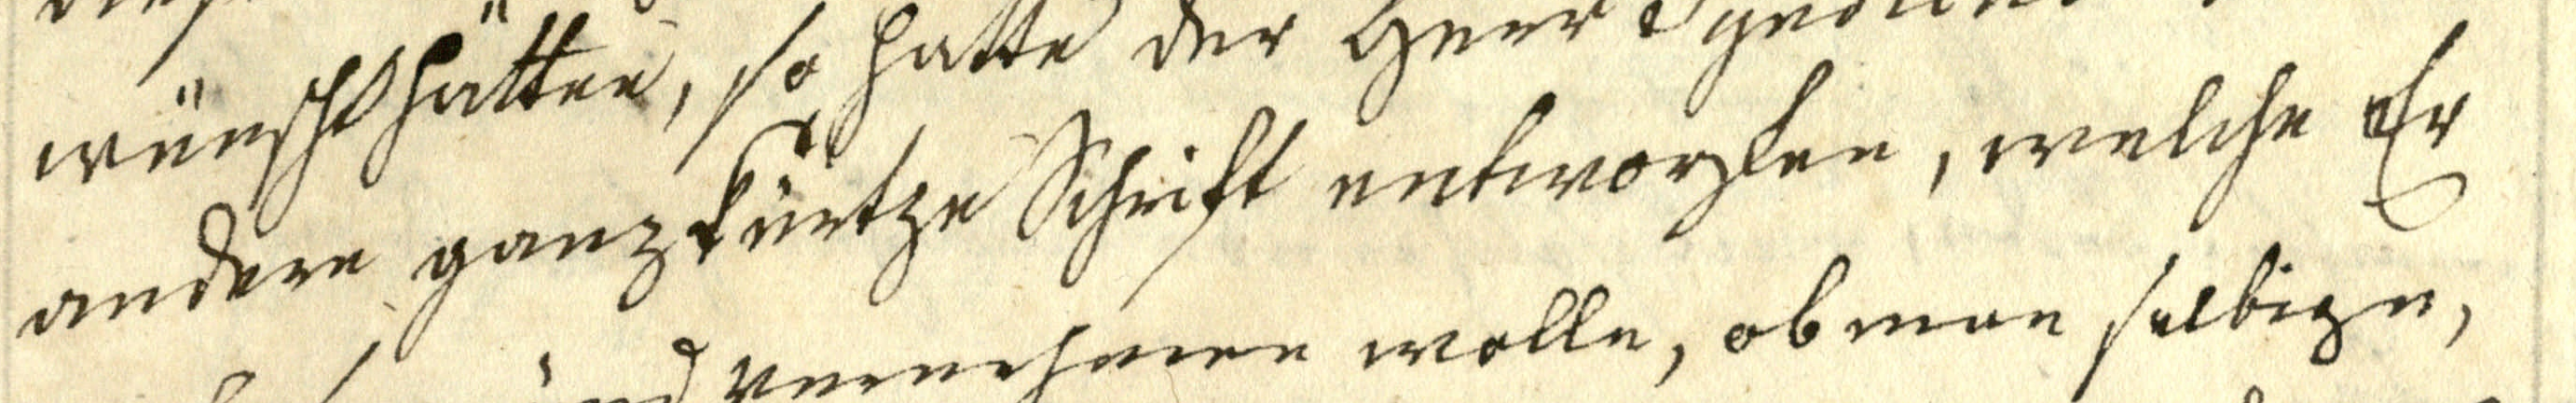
andere ganz kurtze Schrift entworfen, welche Er
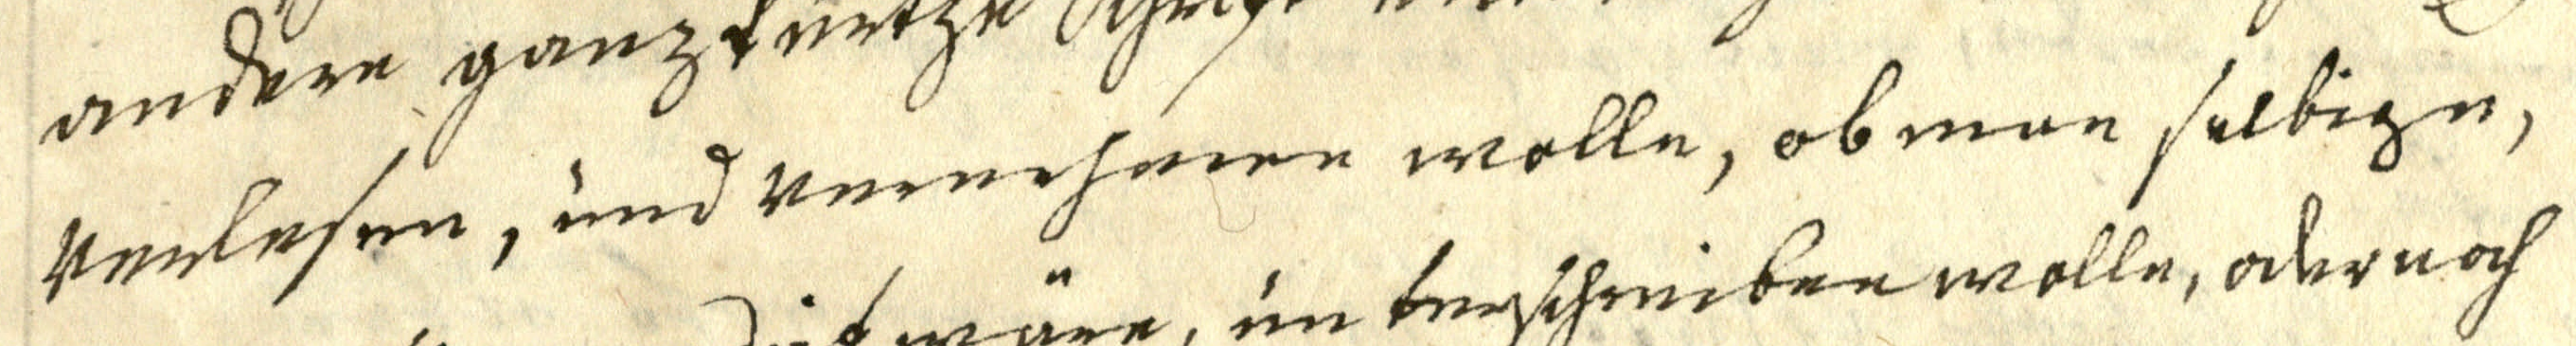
verlesen, und vernehmen wolle, ob man selbige,
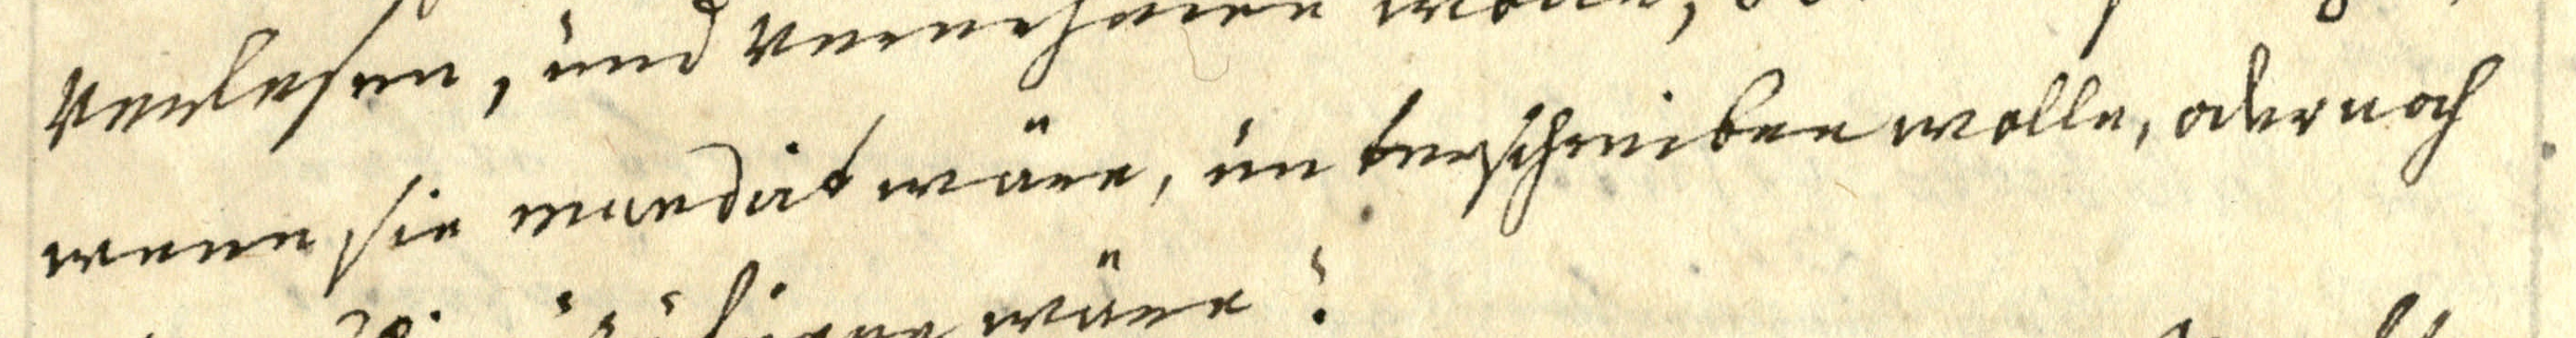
wenn sie mundirt wäre, unterschreiben wolle, oder noch
